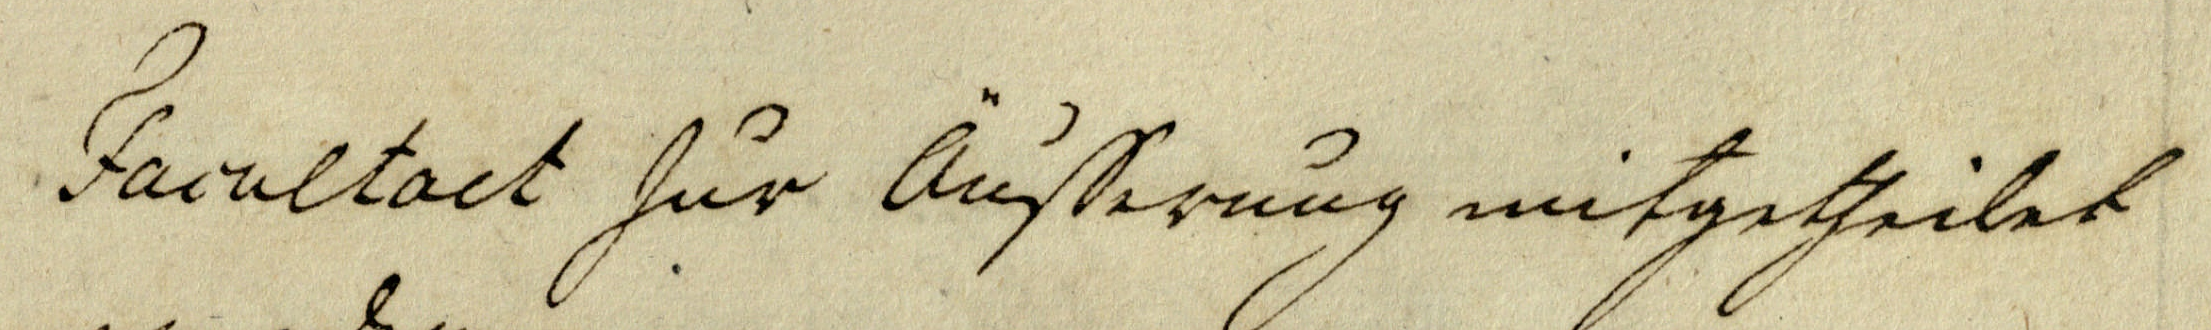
Facultaet zur Äusserung mitgetheilet
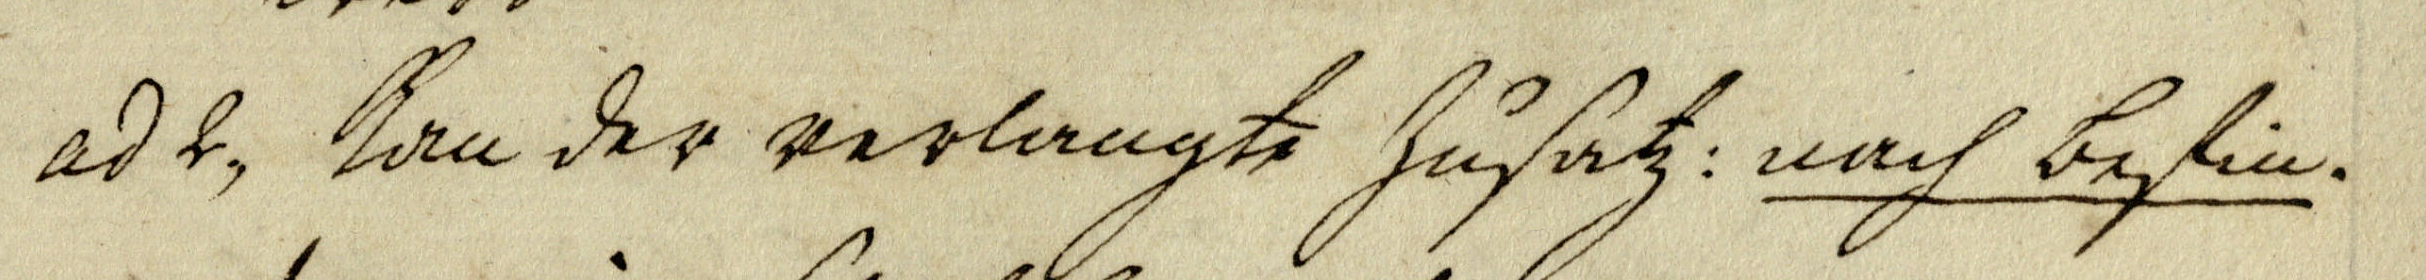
ad 2., Kan der verlangte Zusatz: nach Befin¬
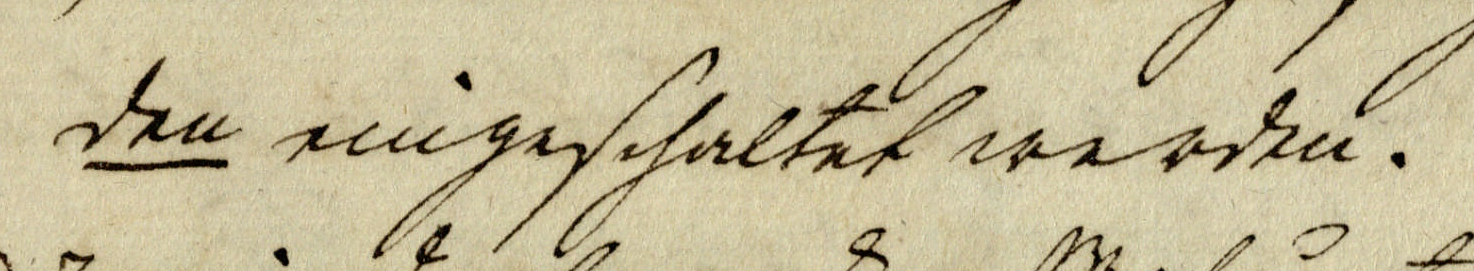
den eingeschaltet werden.
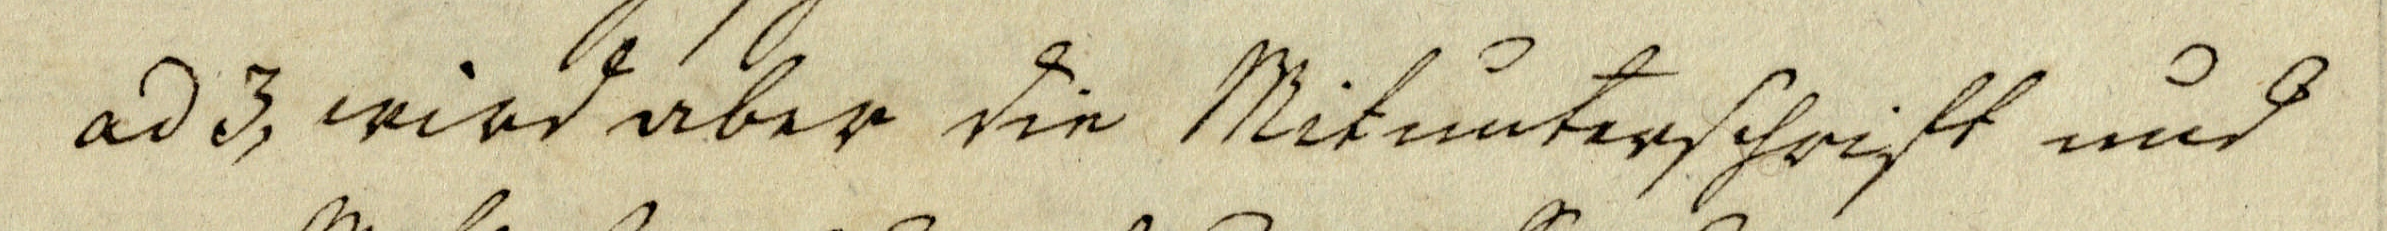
ad 3, wird aber die Mitunterschrift und
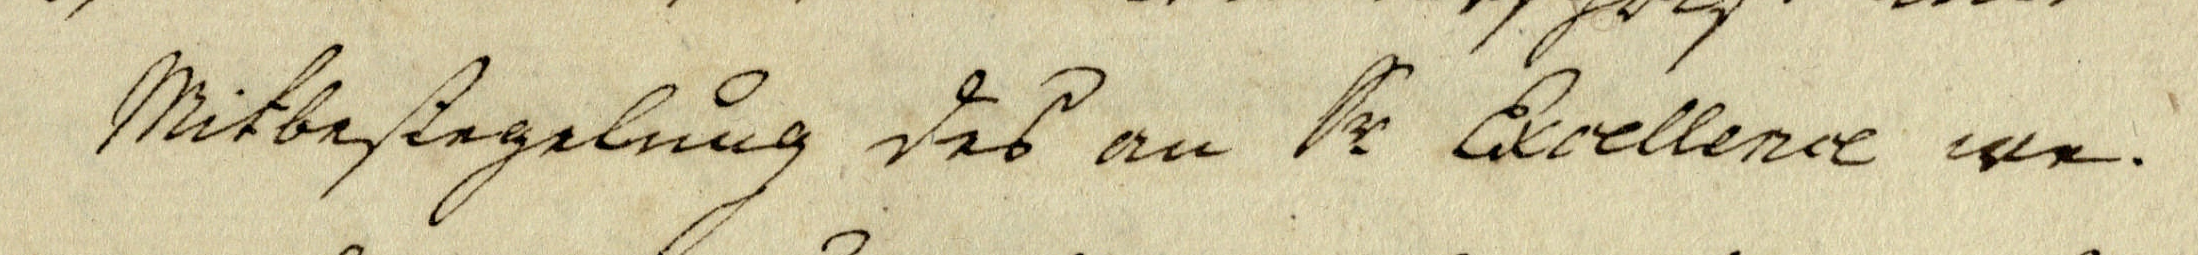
Mitbesiegelung des an Sr Excellence we¬
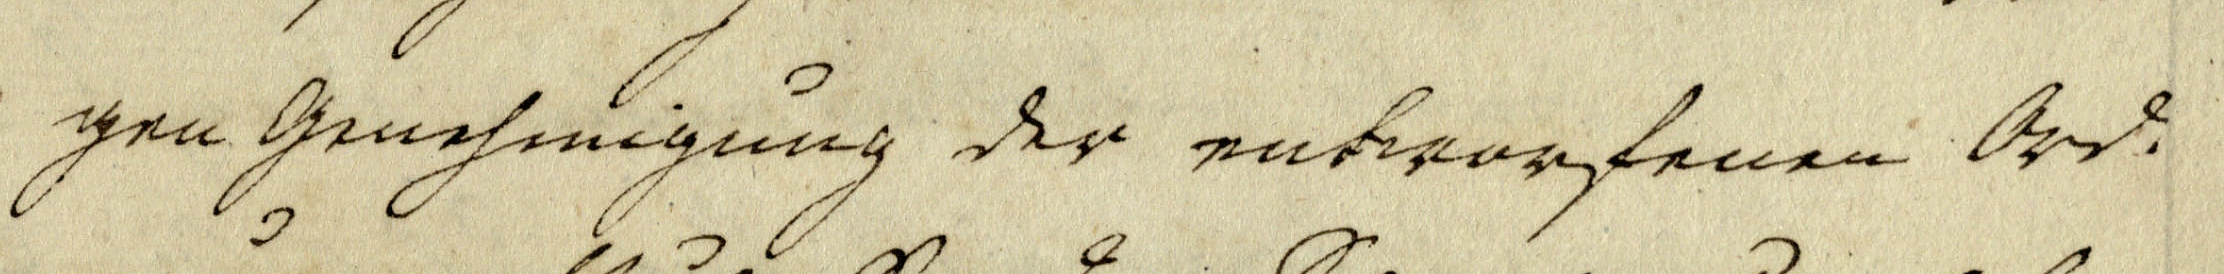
gen Genehmigung der entworfenen Ord¬
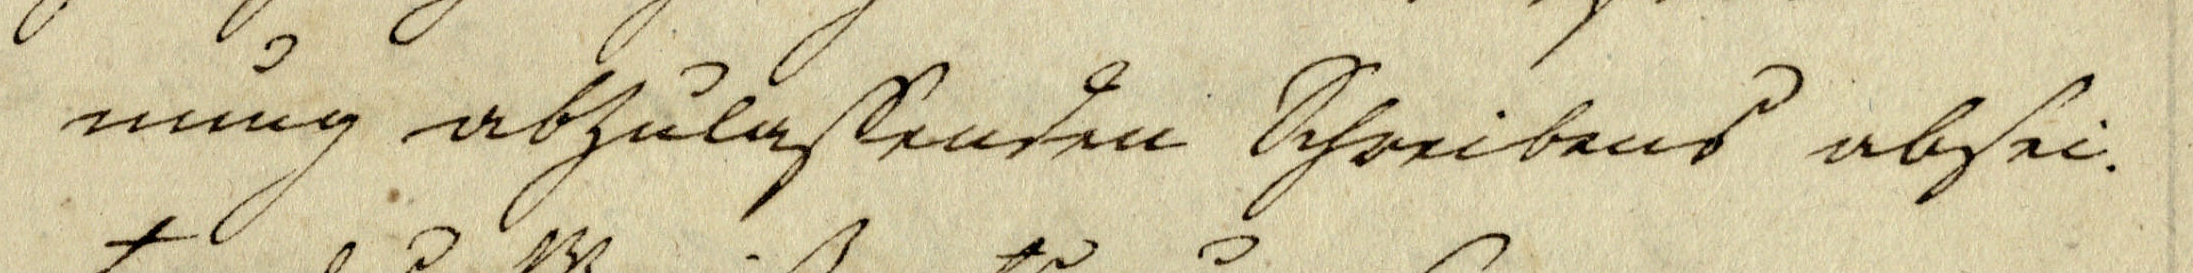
nung abzulassenden Schreibens absei¬
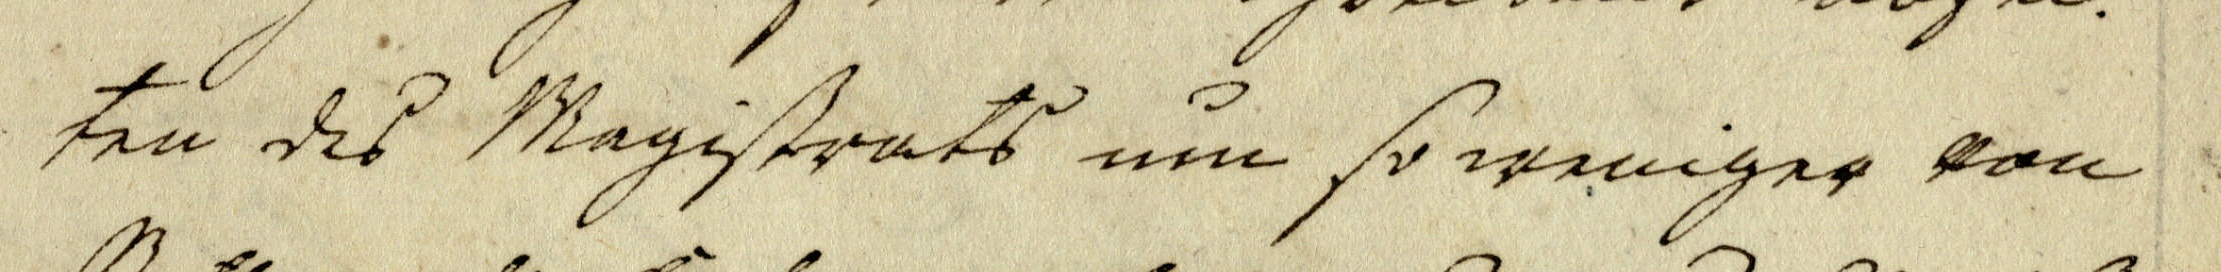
ten des Magistrats um so weniger von
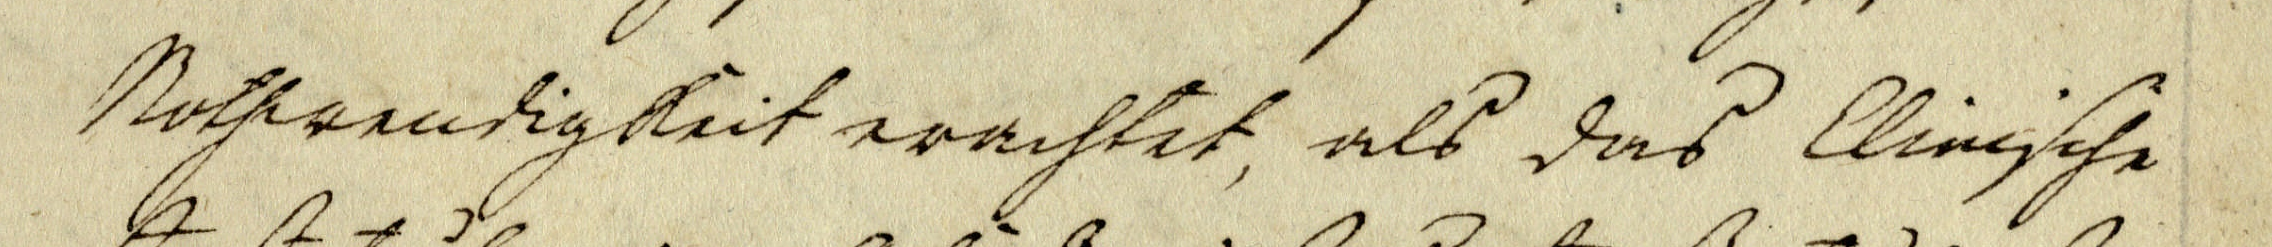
Nothwendigkeit erachtet, als das Clinische
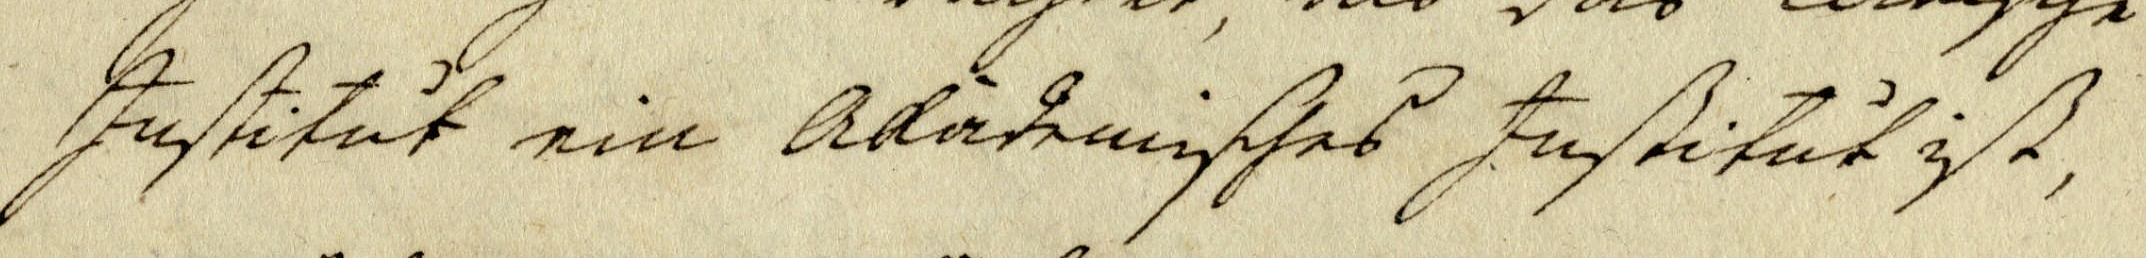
Institut ein Akademisches Institut ist,
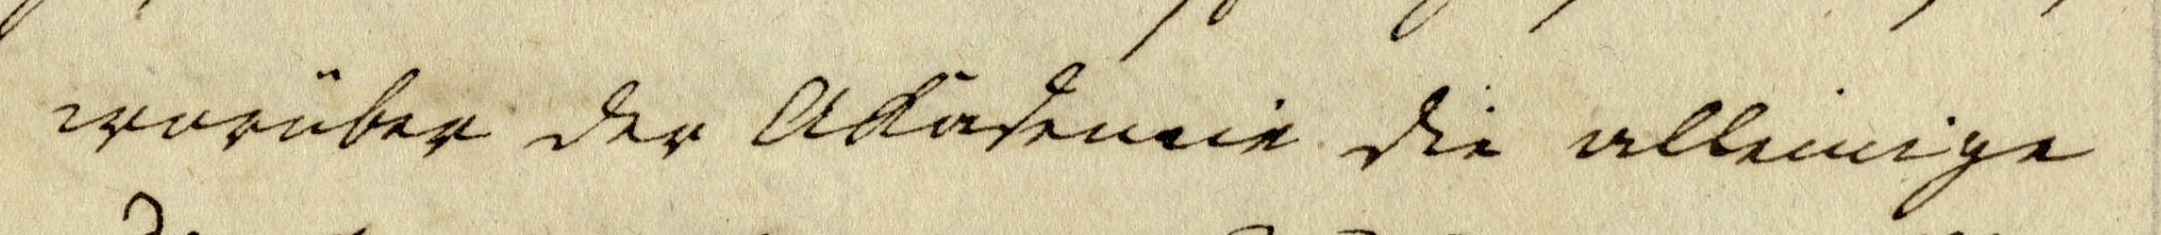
worüber der Akademie die alleinige
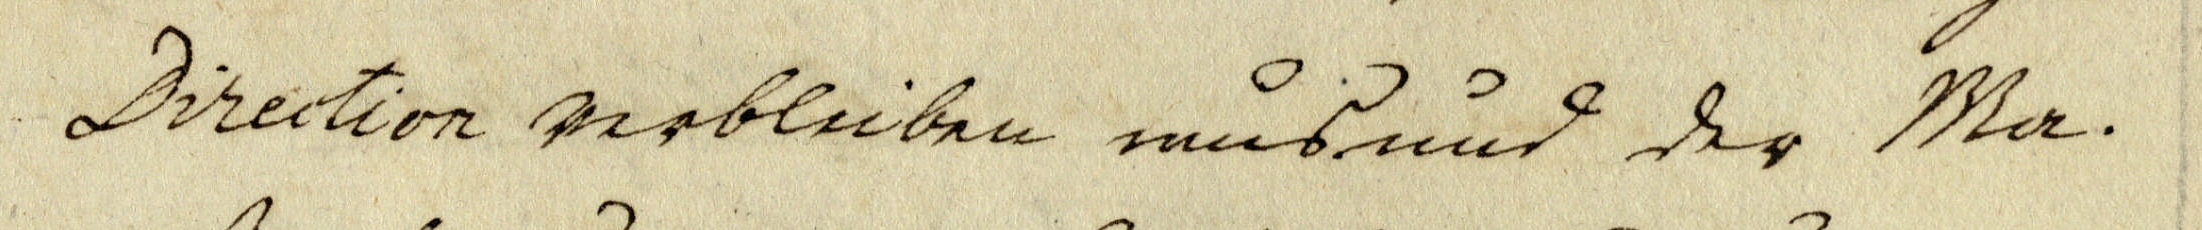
Direction verbleiben mus und der Ma¬
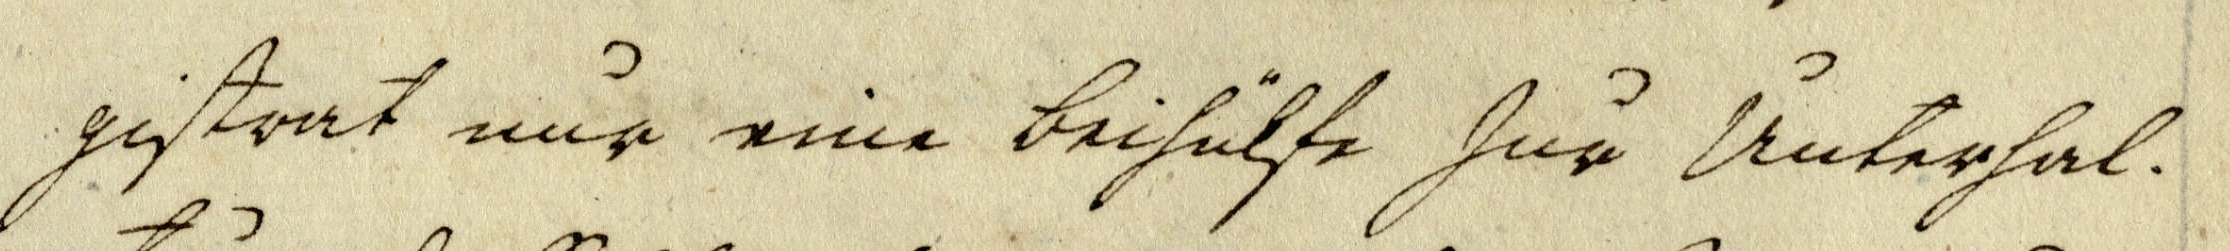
gistrat nur eine Beihülfe zur Unterhal¬
